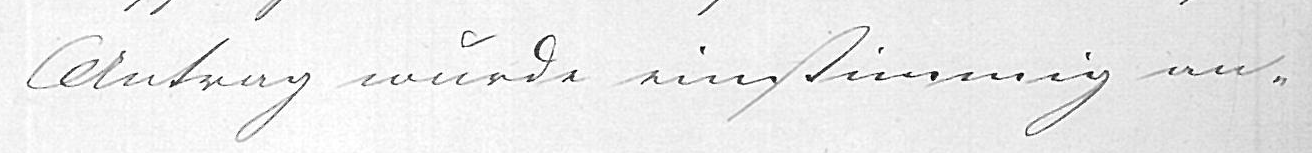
Antrag wurde einstimmig an-
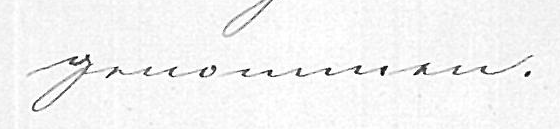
genommen.
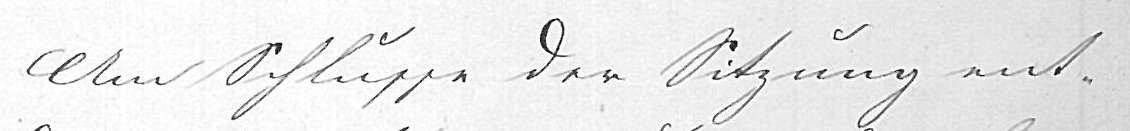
An Schlusse der Sitzung ent-
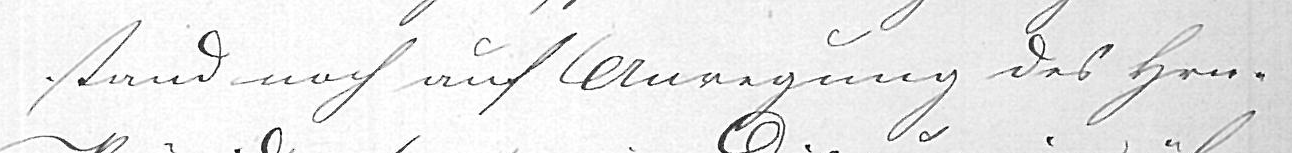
stand noch auf Anregung des Herrn
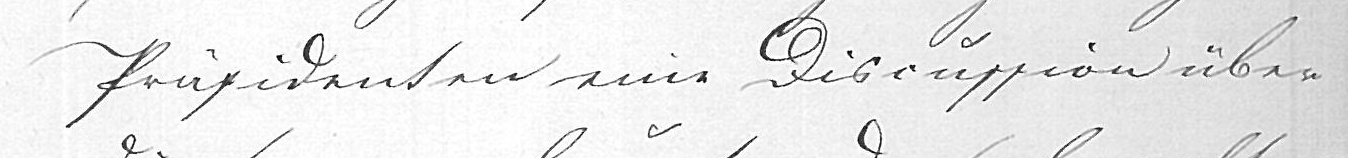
Präsidenten eine Discussion über
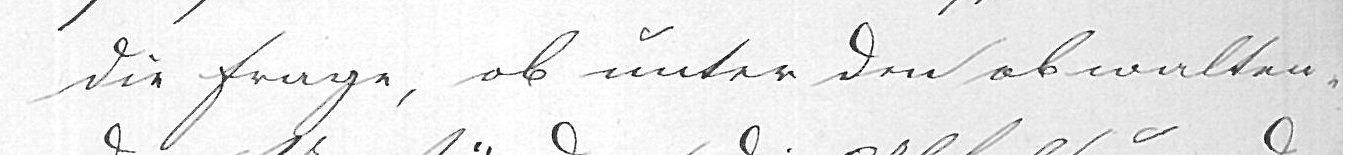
die Frage, ob unter den obwalten-
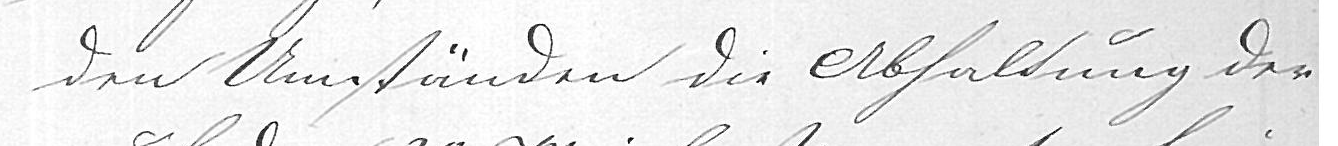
den Umständen die Abhaltung der
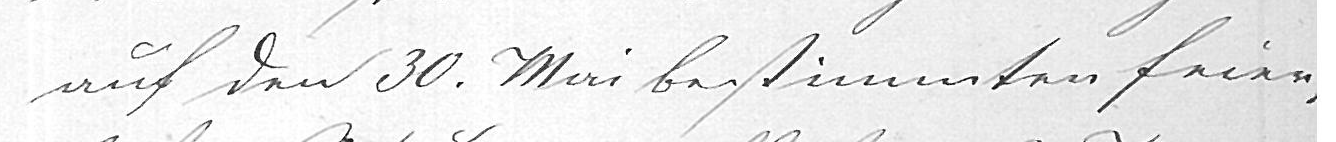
auf den 30. Mai bestimmten feier-
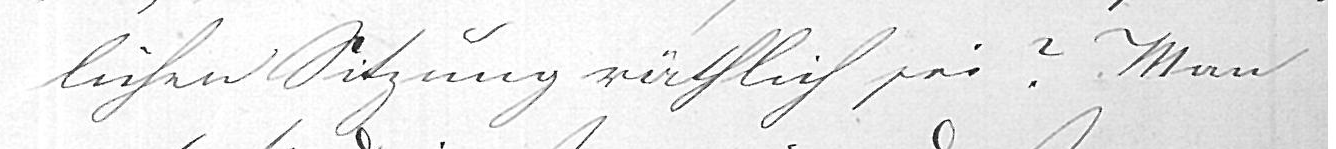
lichen Sitzng räthlich sey? Man
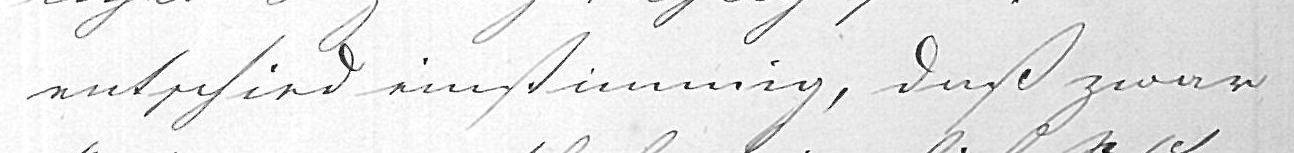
entschied einstimmig, daß zwar
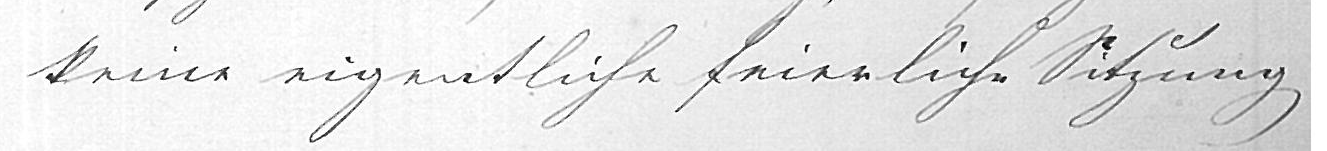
keine eigentliche feierliche Sitzung
